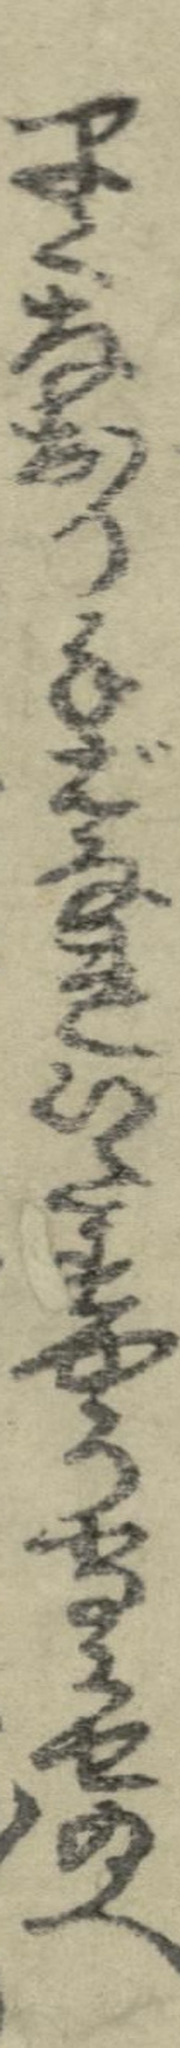早くなおり手ばなれいたすやう守らせ給へ
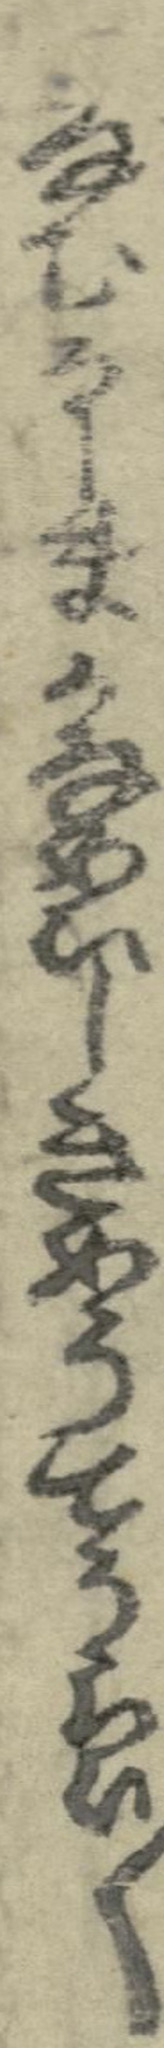なむかしまかなめいしきめうてうらい〳〵
